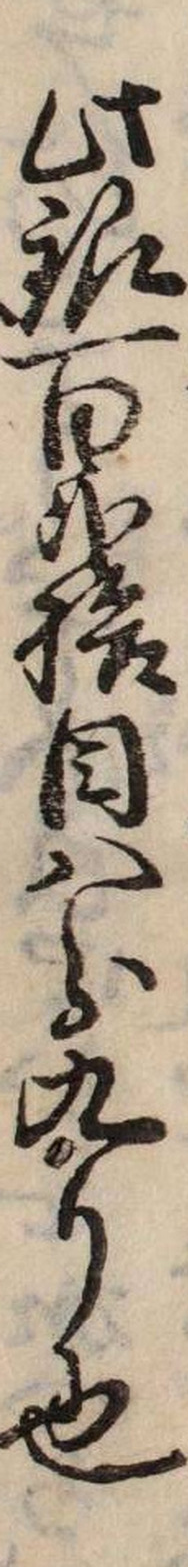此銀百弐拾目八分九り也
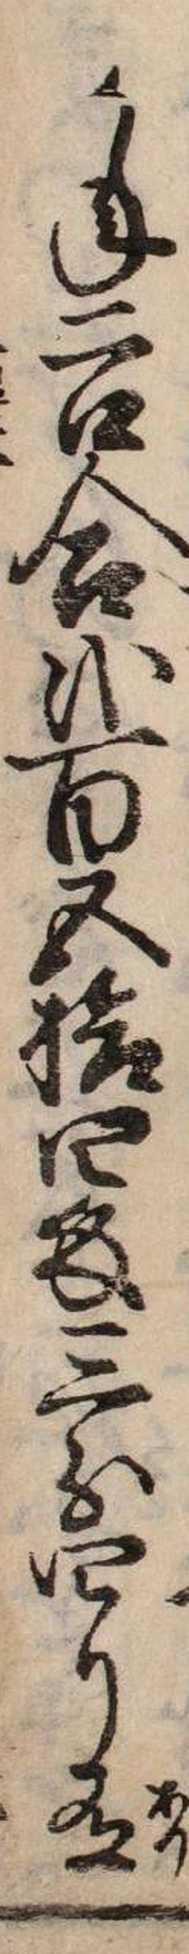かね二口合弐百五拾四匁三分四り有

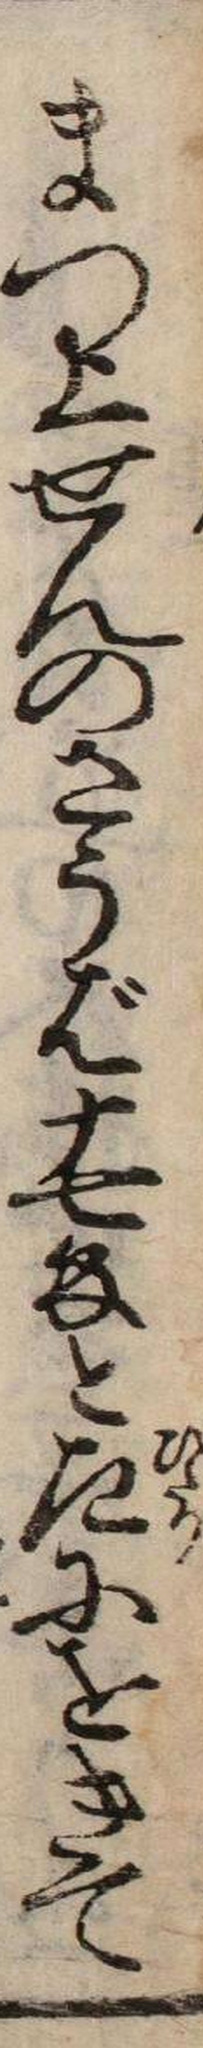まつ上せんのさうば十七匁と左にをきて
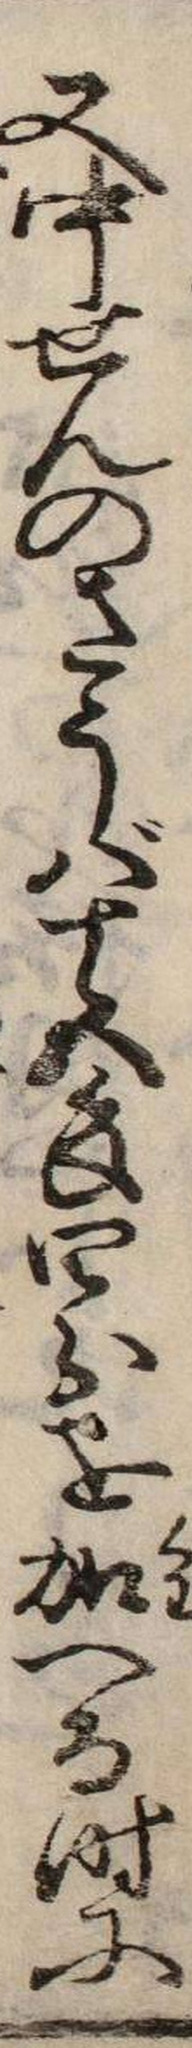又中せんのさうば十五匁四分を加へる時に
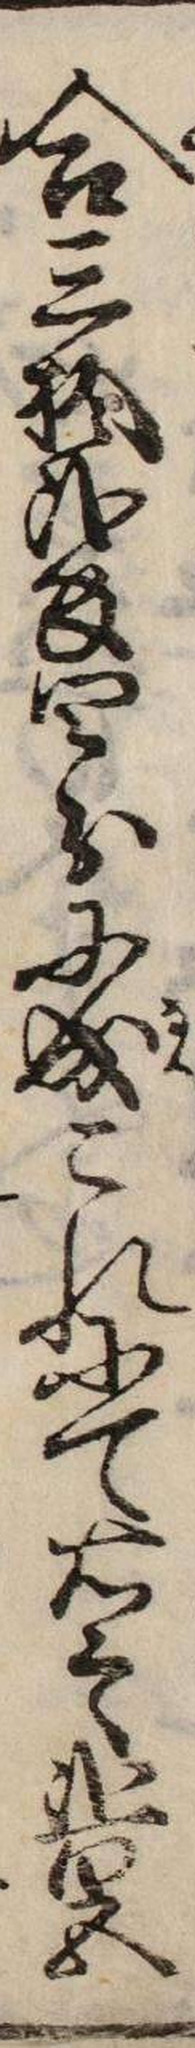合三拾弐匁四分に成これにて右の二百五
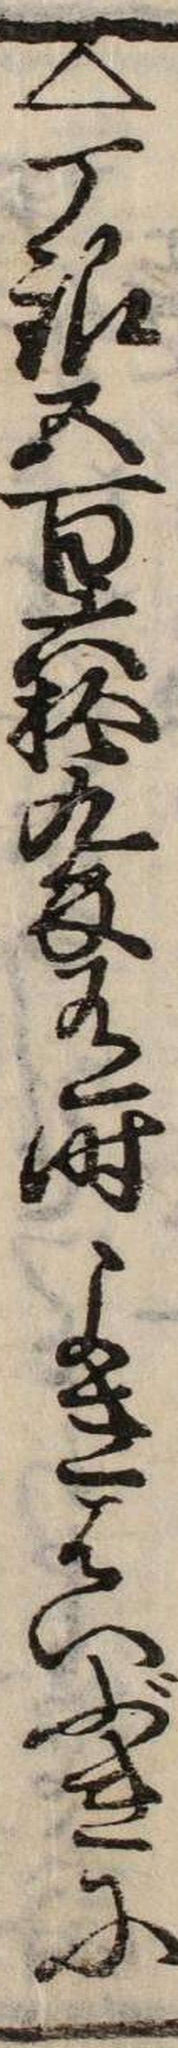△丁銀五百六拾九匁有時よきはいぶきに
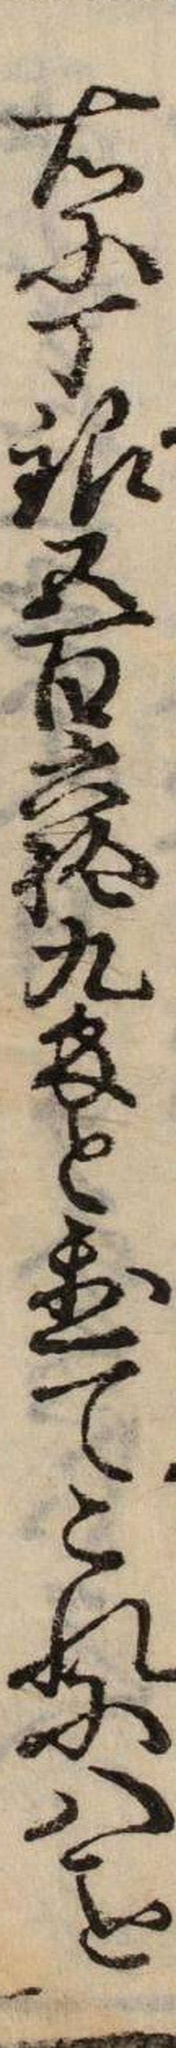右に丁銀五百六拾九匁と置てこれに八を
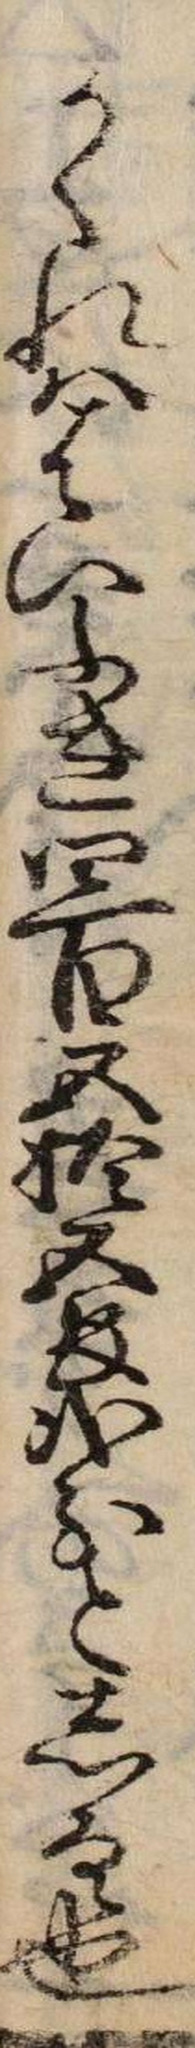かくれははいふき四百五拾五匁弐分としるゝ也
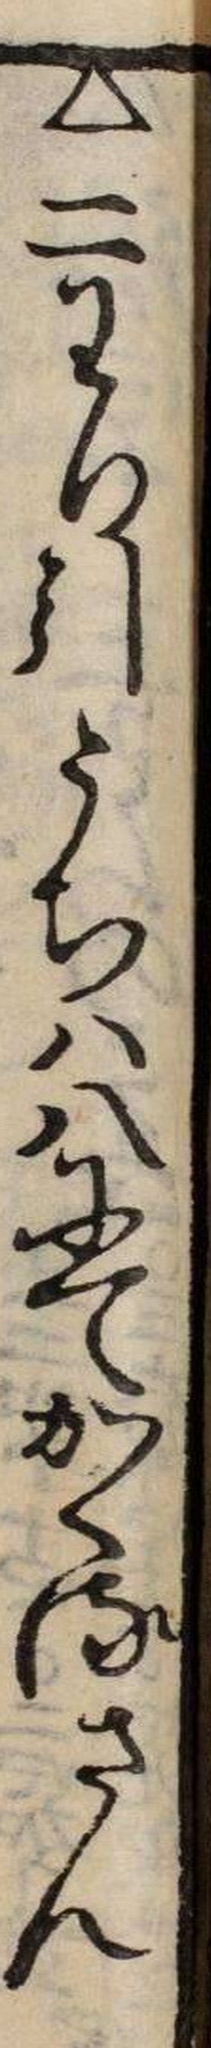△二わり引うちは八にてかくるさん
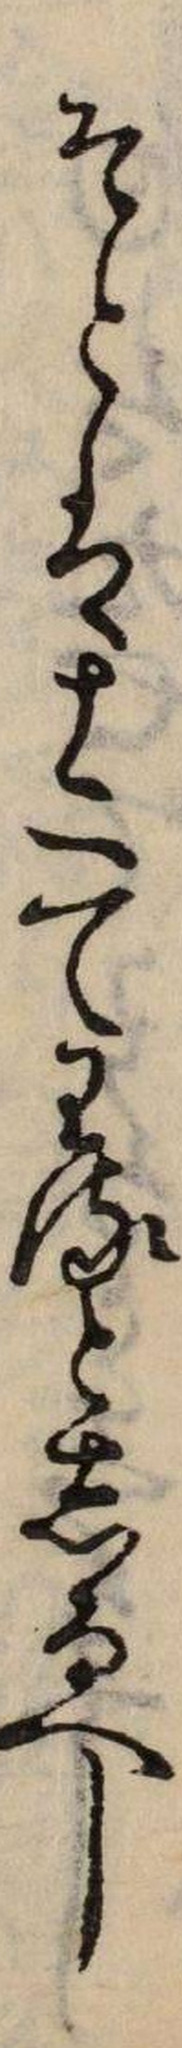そとは十二てわるとしるへし
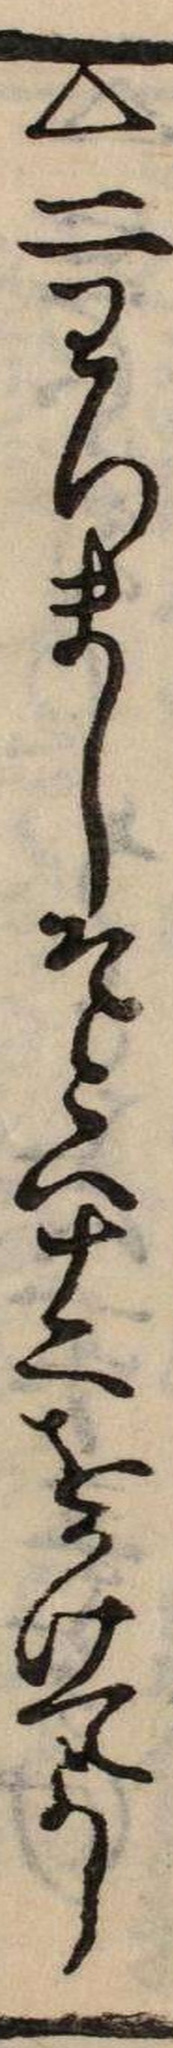△二わりましそとは十二をかけてよし
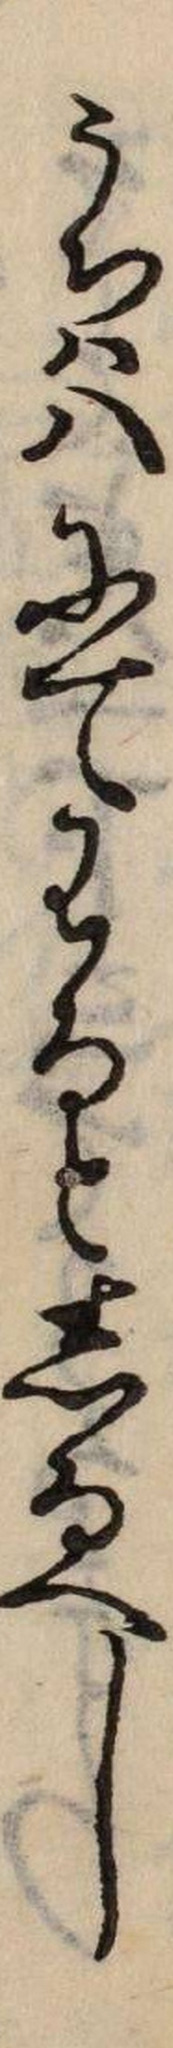うちは八にてわるとしるへし
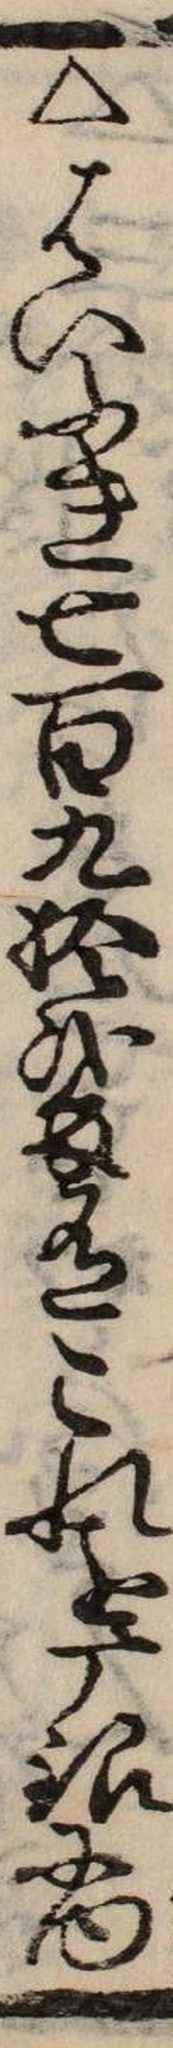△はいふき七百九拾弐匁有これを丁銀に内
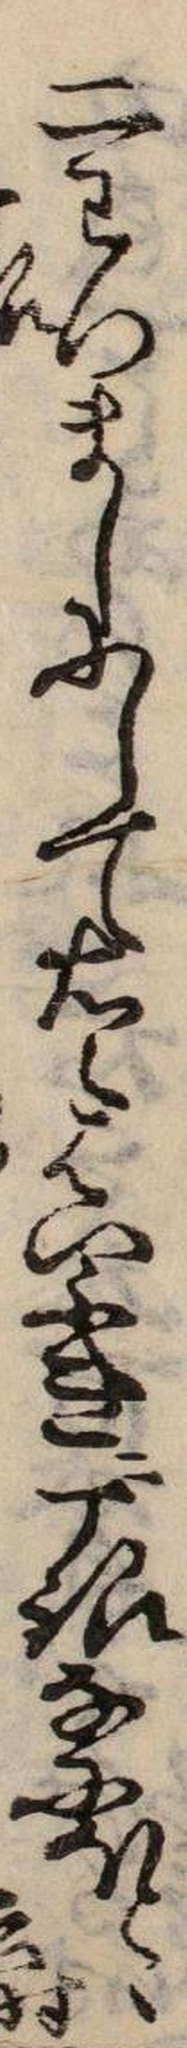二わりましにして右のはいふきに丁銀なにほとと云時
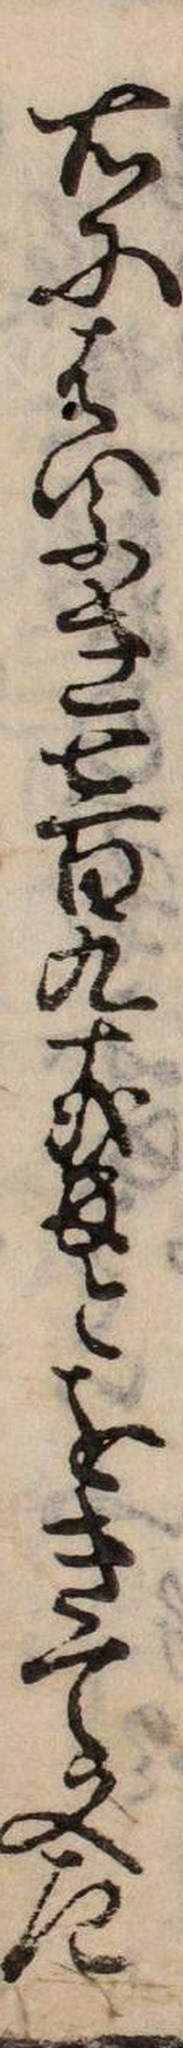右にはいふき七百九十弐匁とをきて又左
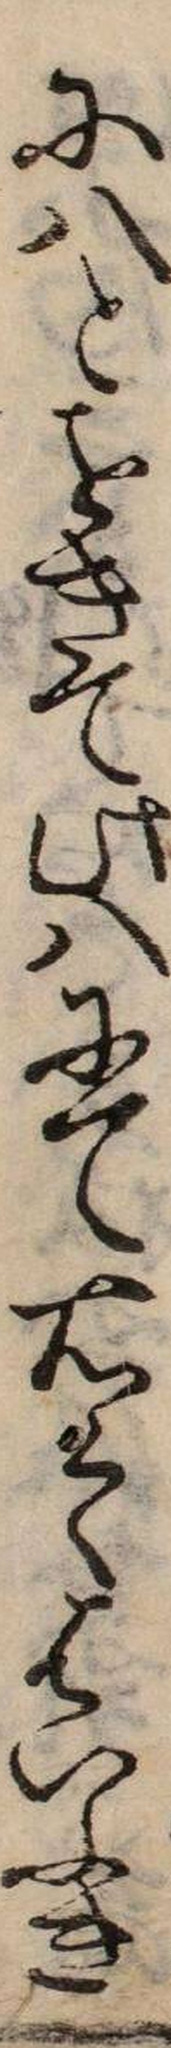に八とをきて此八にて右のはいふき
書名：塵劫記（寛永11年自跋、京都府立京都学・歴彩館追貴8）
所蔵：京都府立京都学・歴彩館 国文学研究資料館
